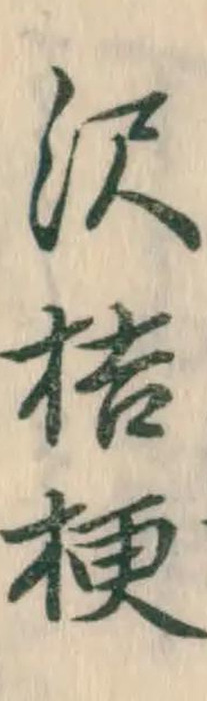沢桔梗

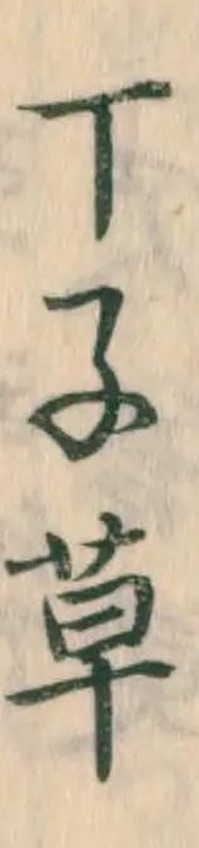丁子草
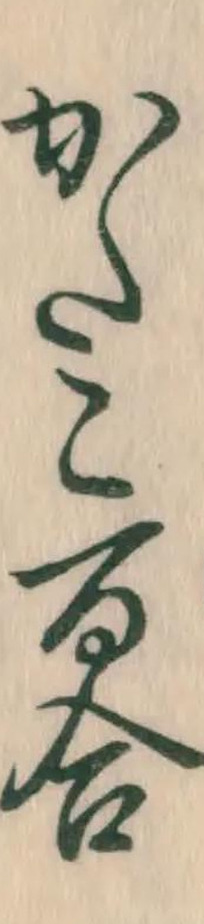かたこ百合
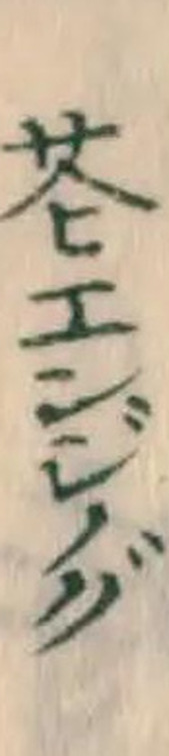花エンジノグ
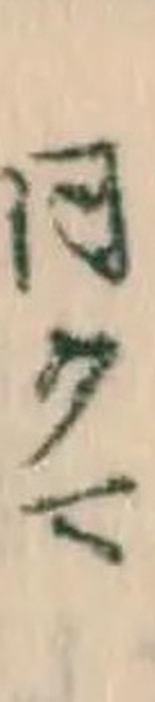同クマ
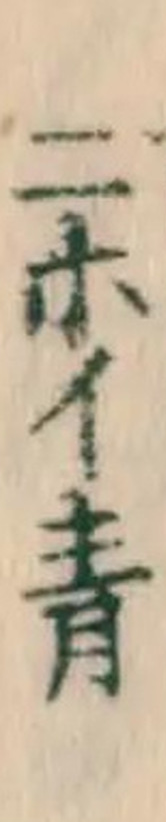ニホイ青
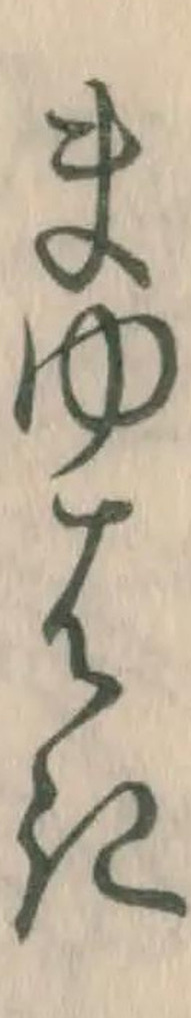まゆはき
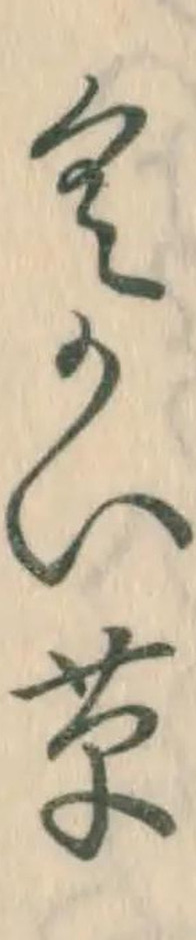くかい草

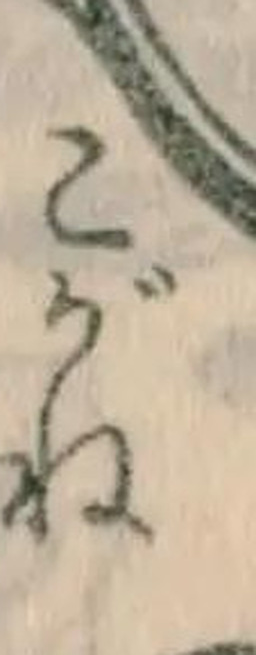こがね
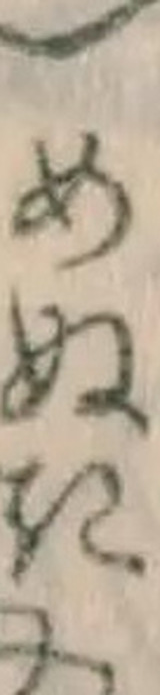めぬき
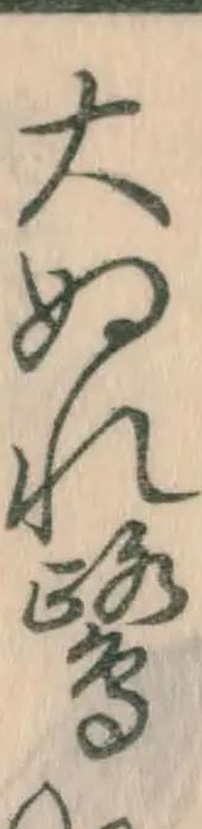大ぬれ鷺
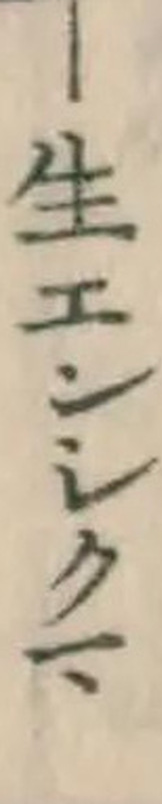生エンシクマ
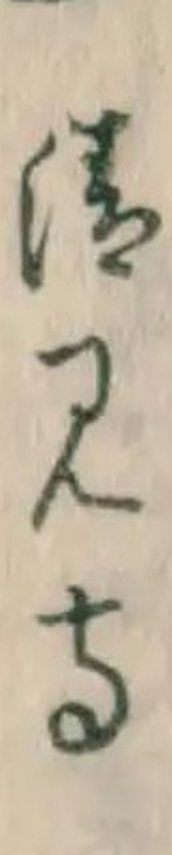清見寺
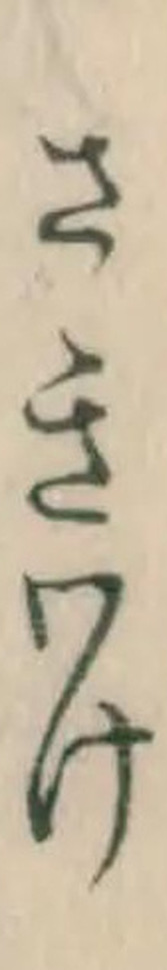さきわけ
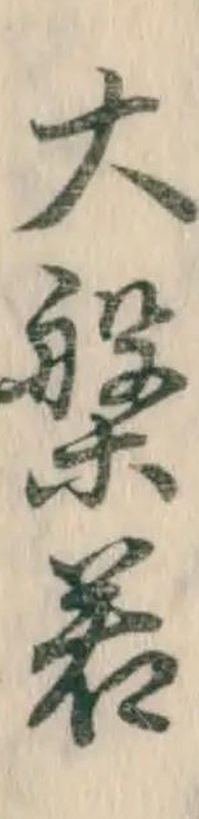大槃若

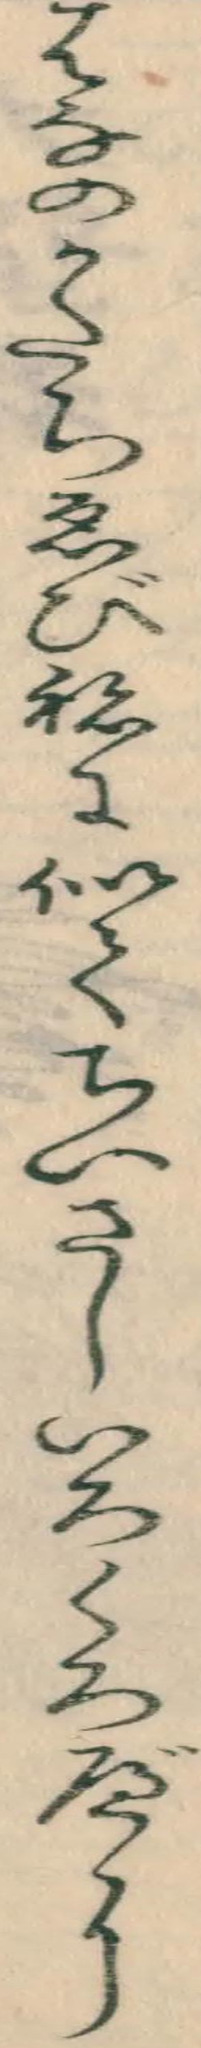はなのかたちゑびねに似てちいさしいろくろべに
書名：畫本野山草. [1]
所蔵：国立国会図書館 National Diet Library, JAPAN
